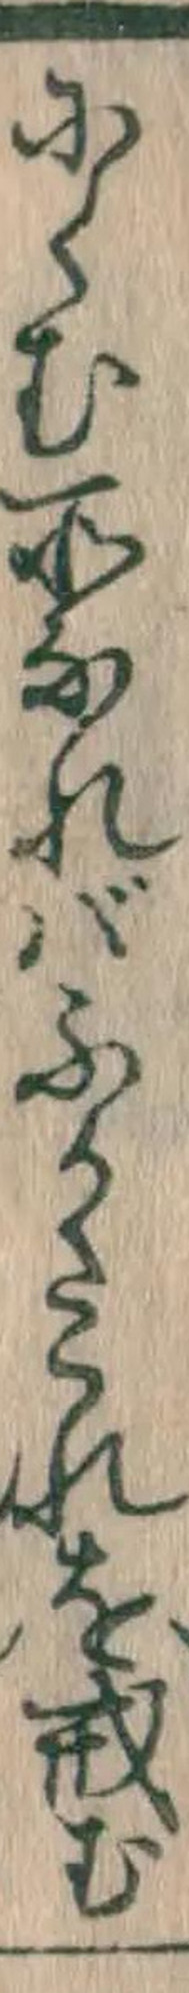にくむ所なればふかくこれを戒む
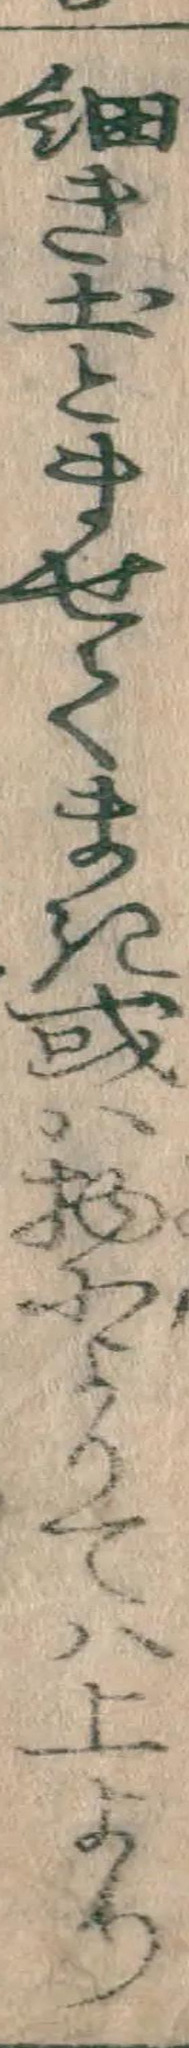細き土とませてまき或は物によりては上より
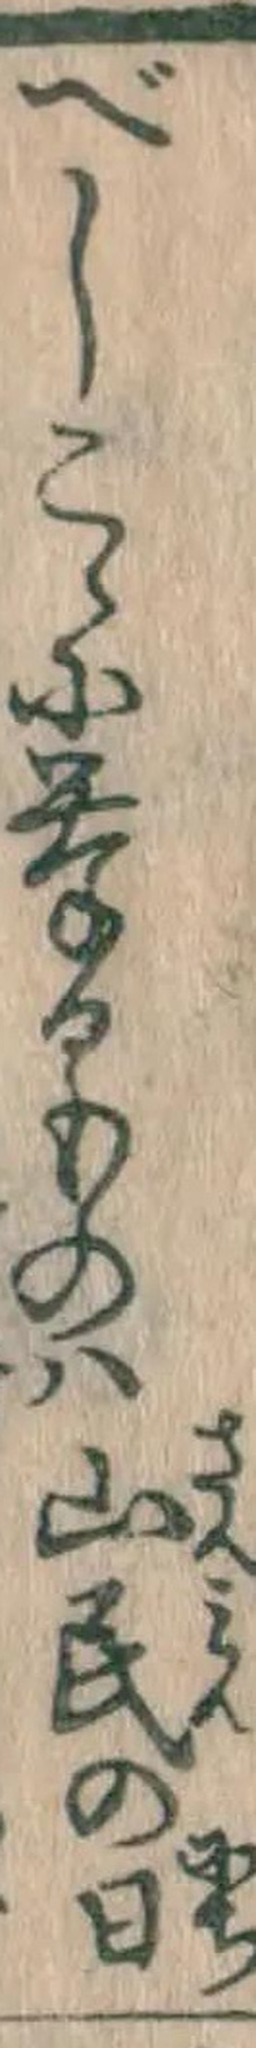べしこゝに挙るものは山民の日
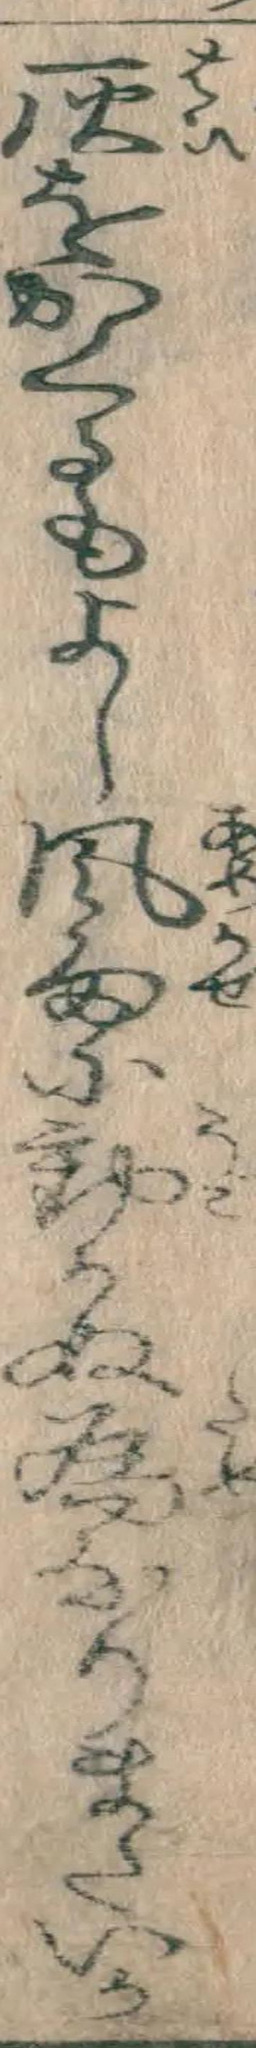灰をかくるもよし風雨に動かぬ為なりまたいか
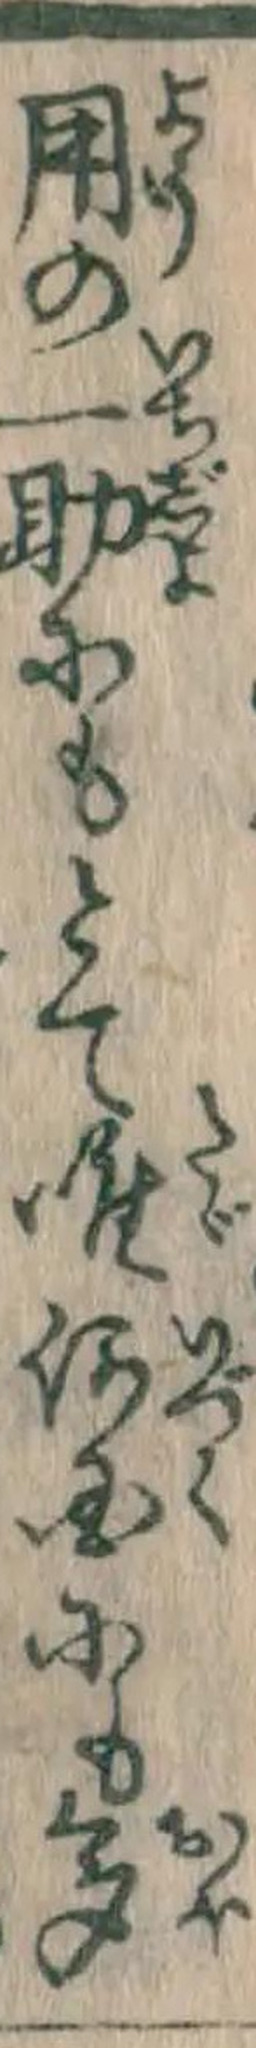用の一助にもとて唯何国にも多
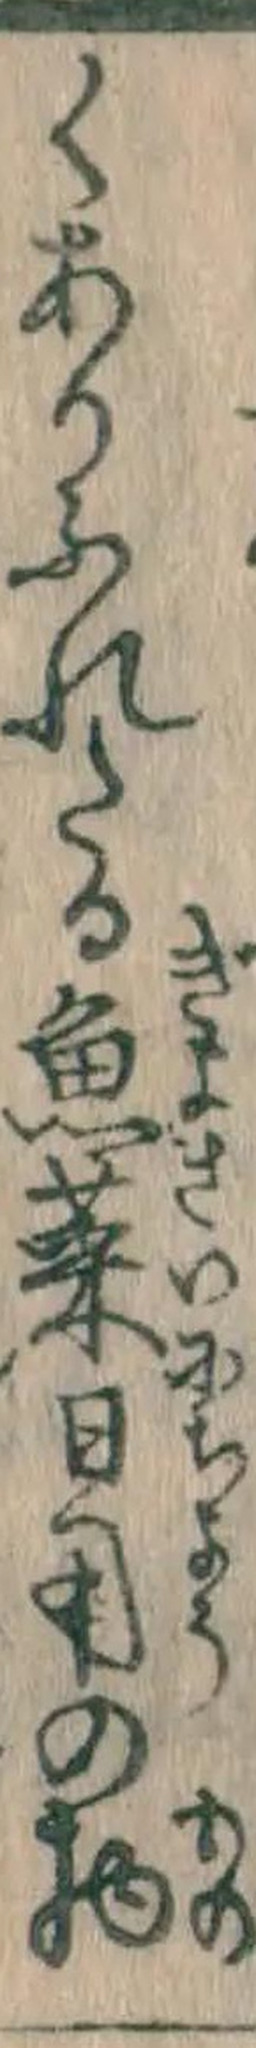くありふれたる魚菜日用の物
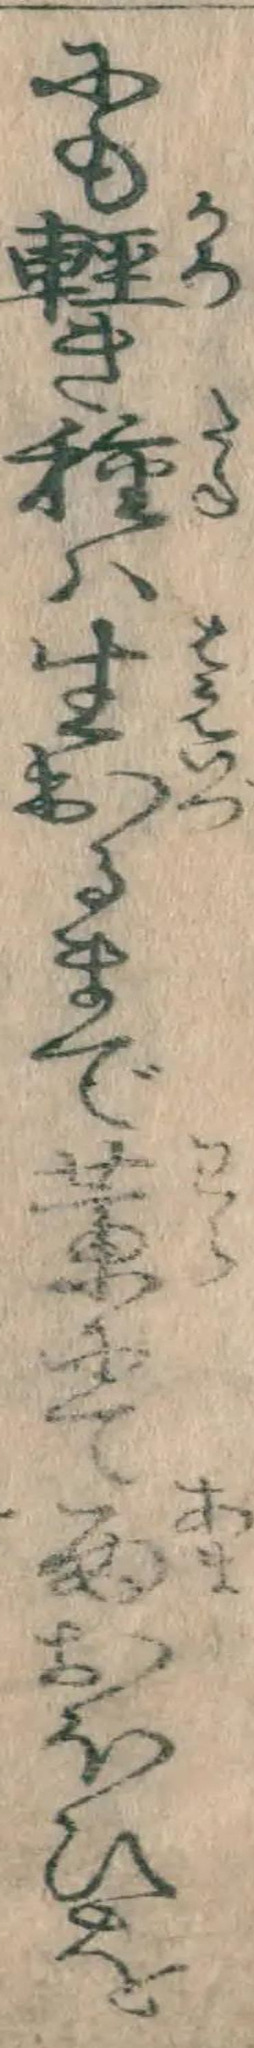にも軽き種は生出るまで藁にて雨おほひを
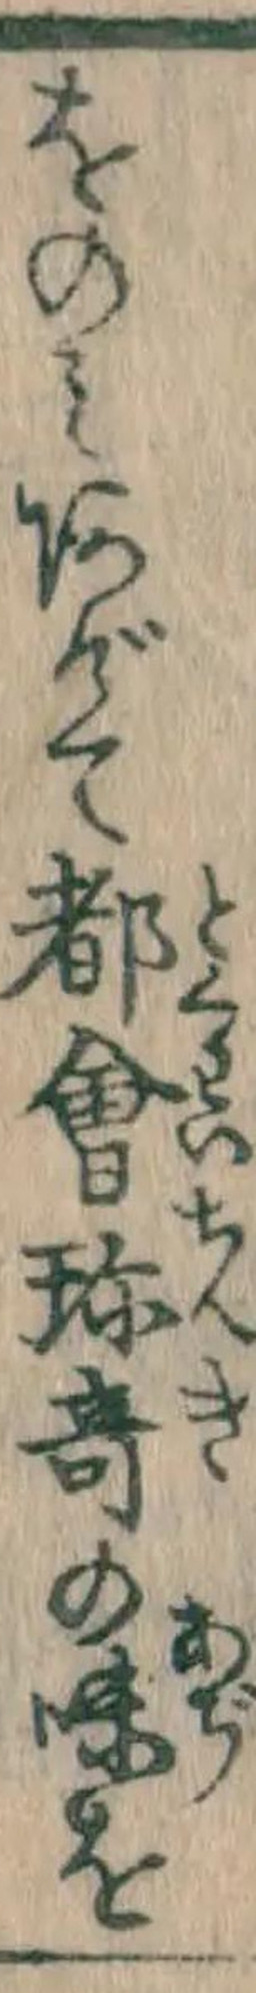をのみあげて都会珍奇の味を
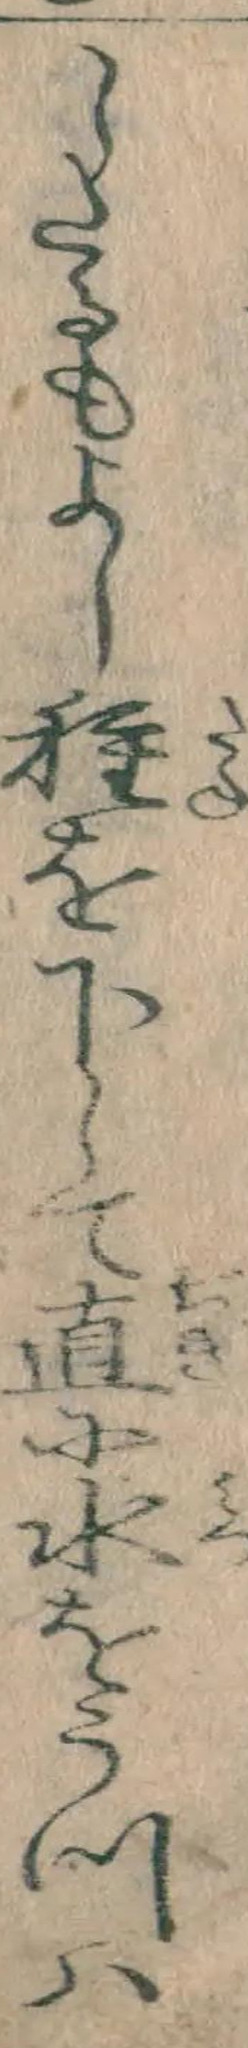したるもよし種を下して直に水をうつは

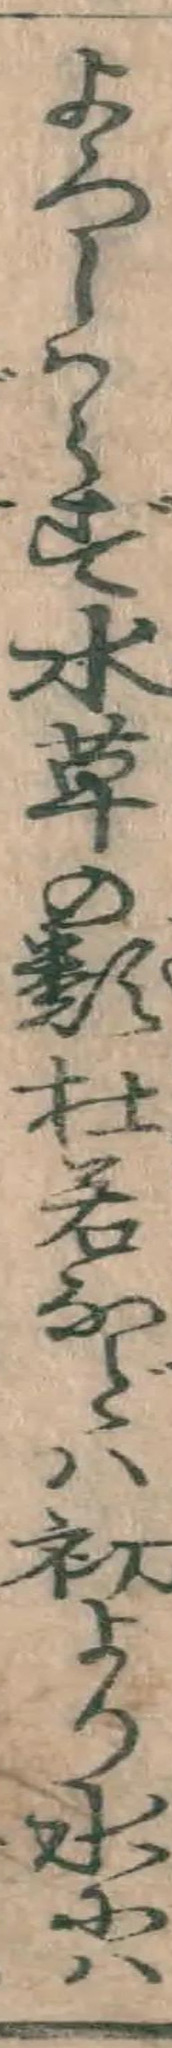よろしからず水草の類杜若などは初より水には
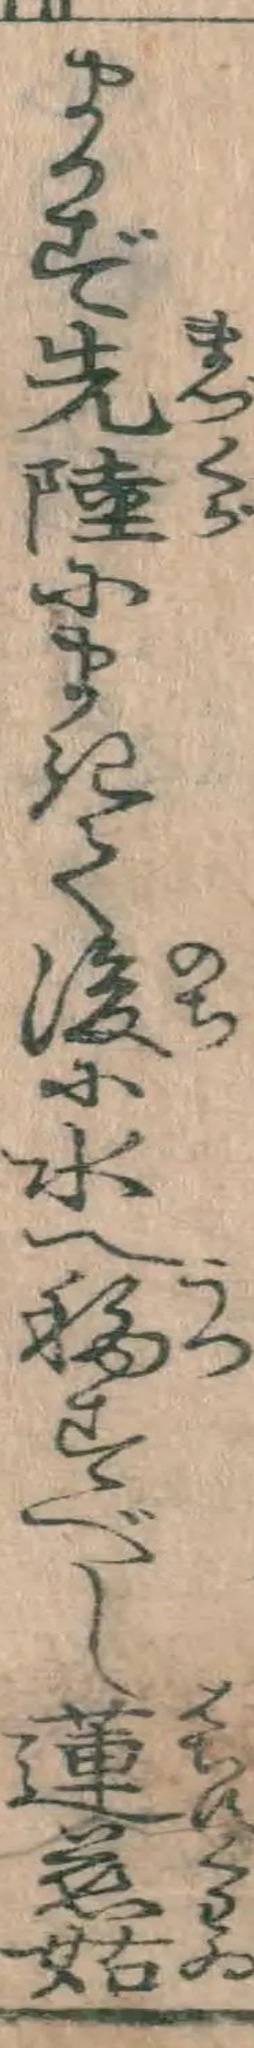まかず先陸にまきて後に水へ移すべし蓮慈姑
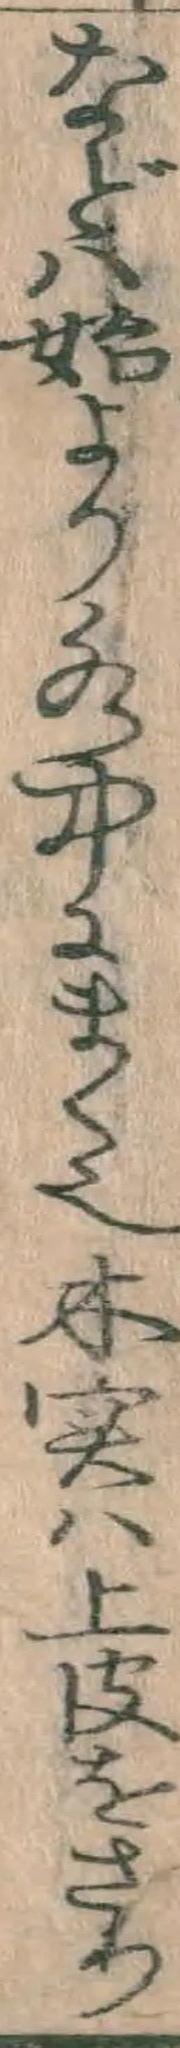などは始より水中にまく也木実は上皮をさり
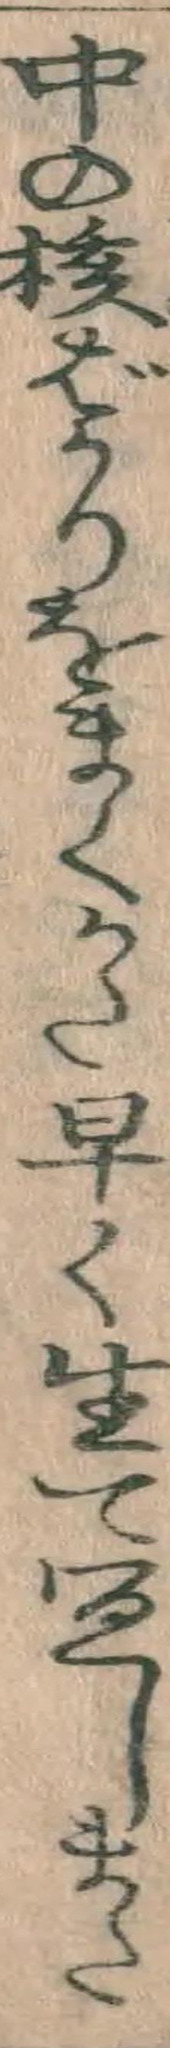中の核ばかりをまくかた早く生て宜しまた
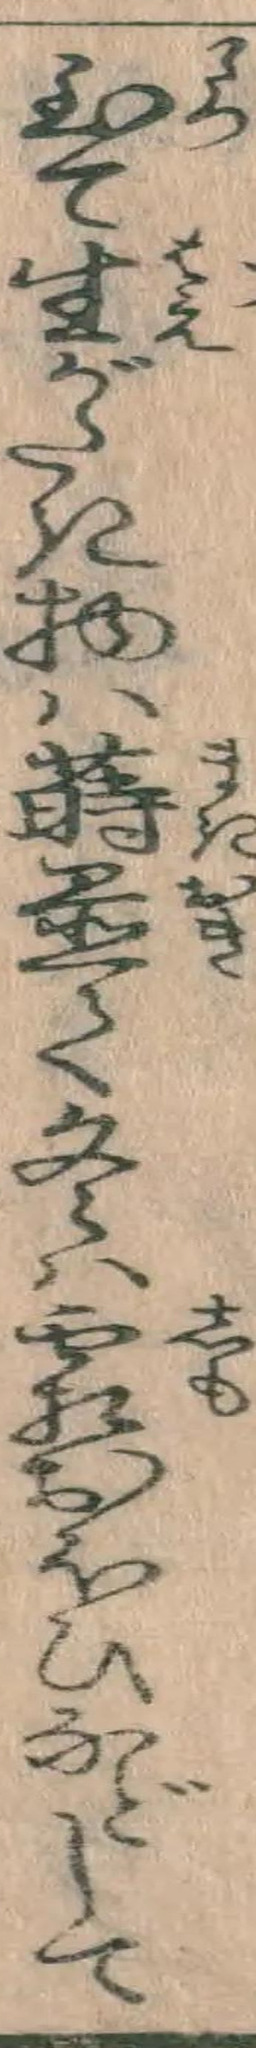至て生がたき物は蒔置て冬は霜おほひなどして
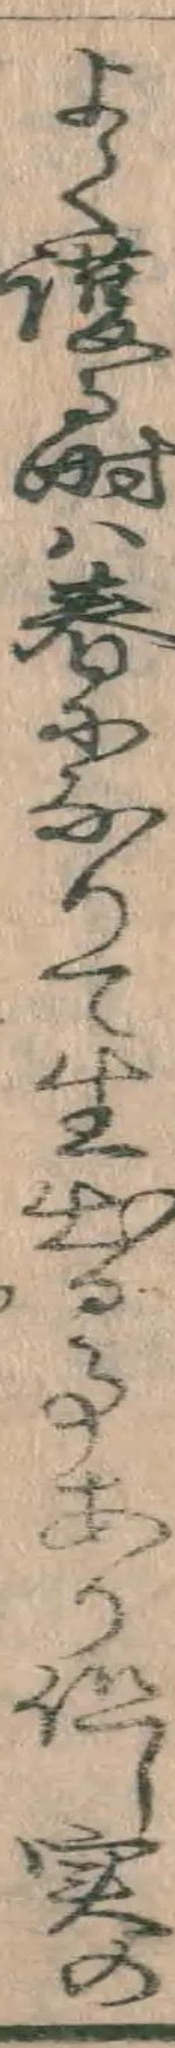よく護る時は春になりて生出る事あり但し実の
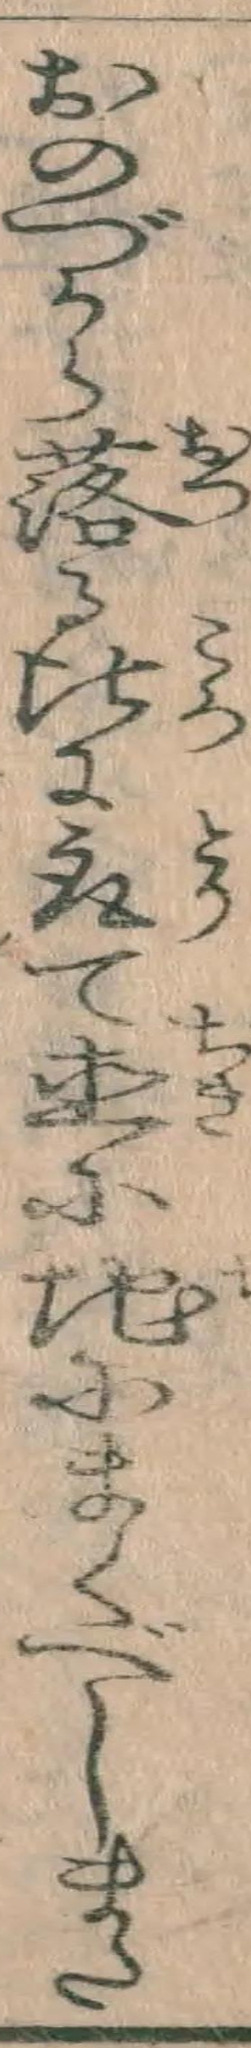おのづから落る比に取て直に地にまくべしまた
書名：広益秘事大全 3巻. [5]
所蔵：国立国会図書館 National Diet Library, JAPAN
